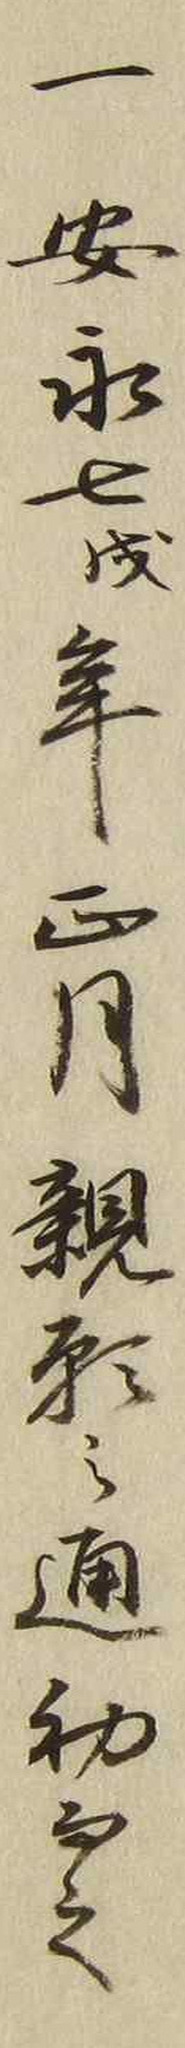一安永七戌年正月親願之通初而之

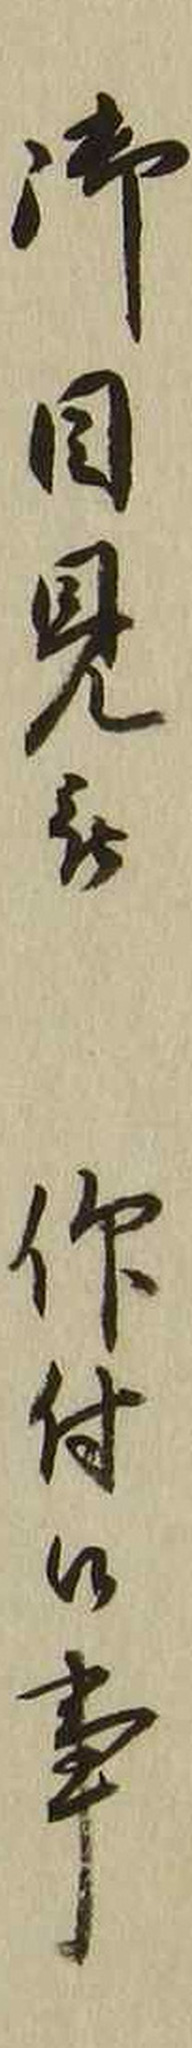御目見被仰付候事
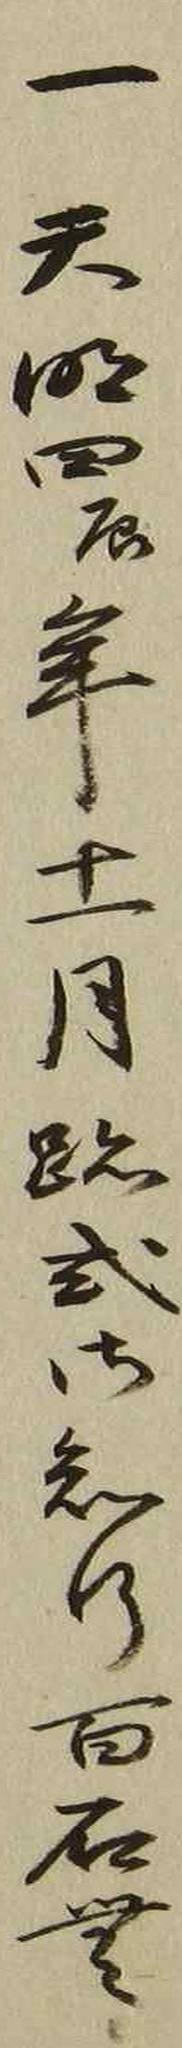一天明四辰年十一月跡式御知行百石無
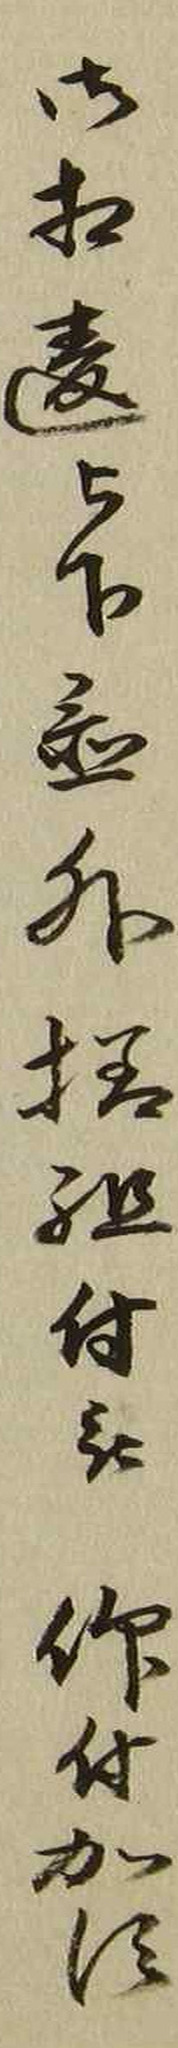御相違被下置外様組付被仰付加須
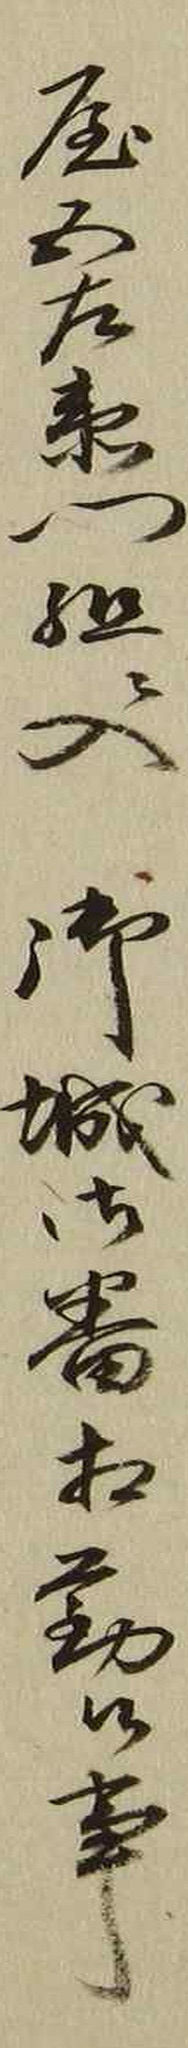屋五左衛門組ニ入御城御番相勤候事
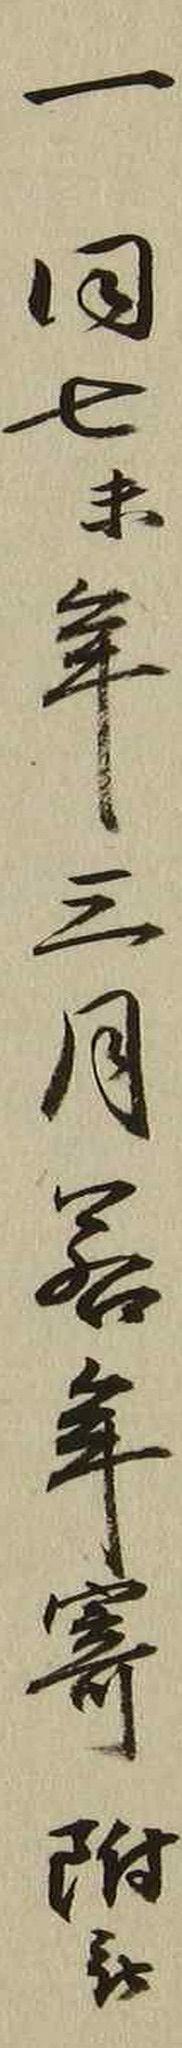一同七未年三月若年寄附被
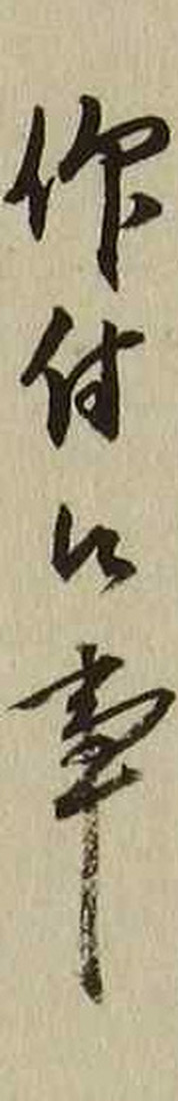仰付候事
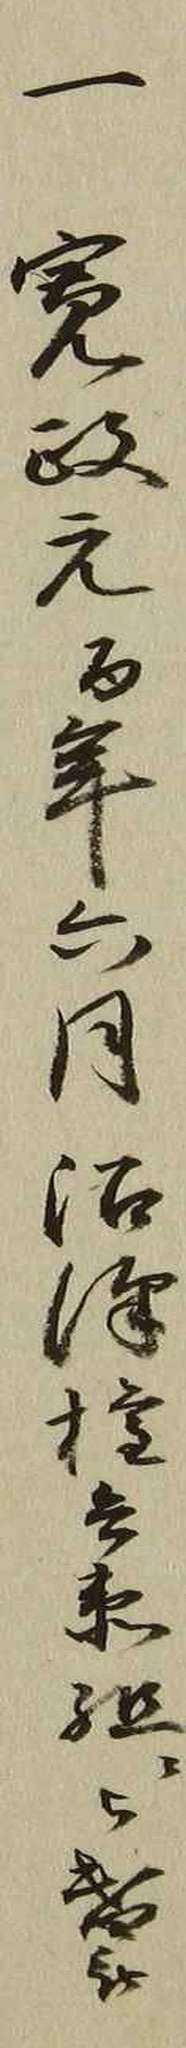一寛政元酉年六月沼澤権兵衛組ニ被替被
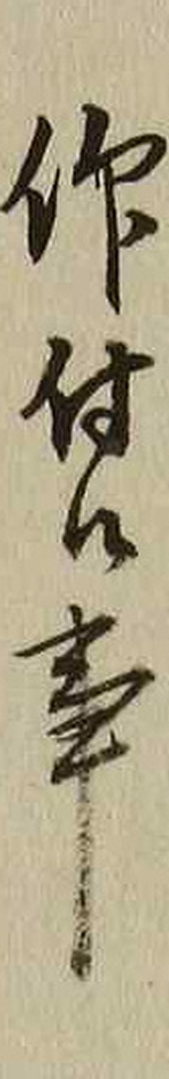仰付候事
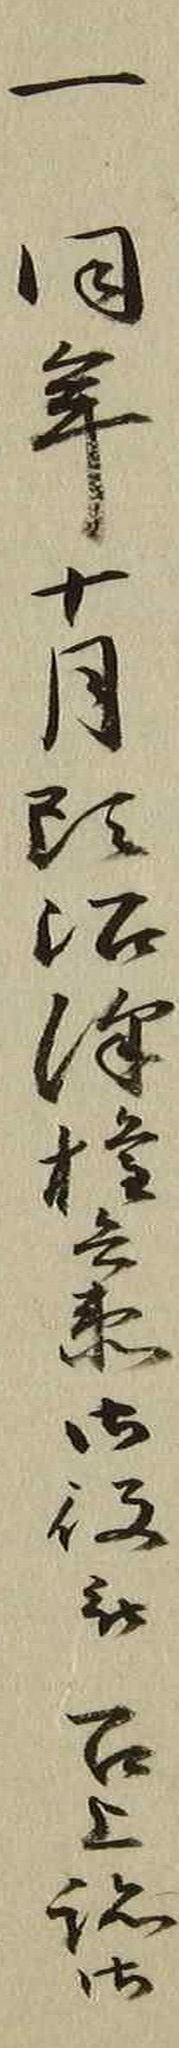一同年十月頭沼澤権兵衛御役被召上跡御
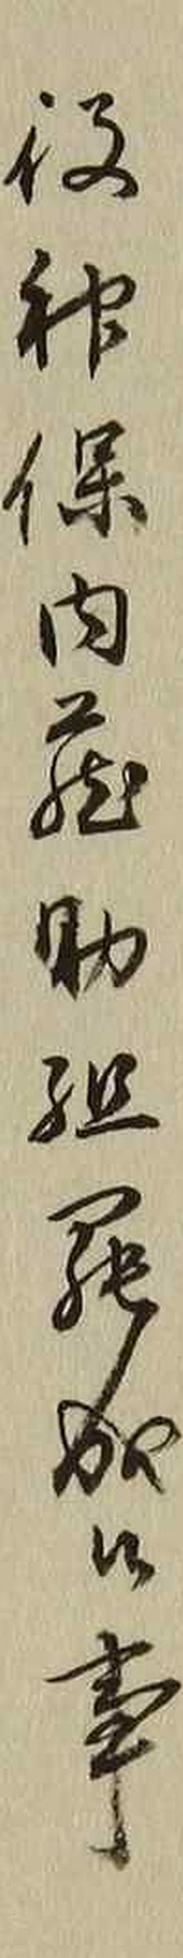役神保内蔵助組罷成候事
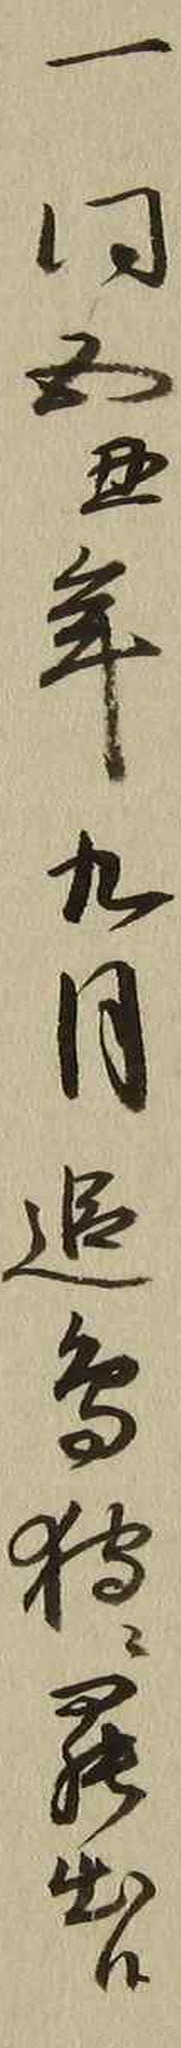一同五丑年九月追鳥狩ニ罷出候
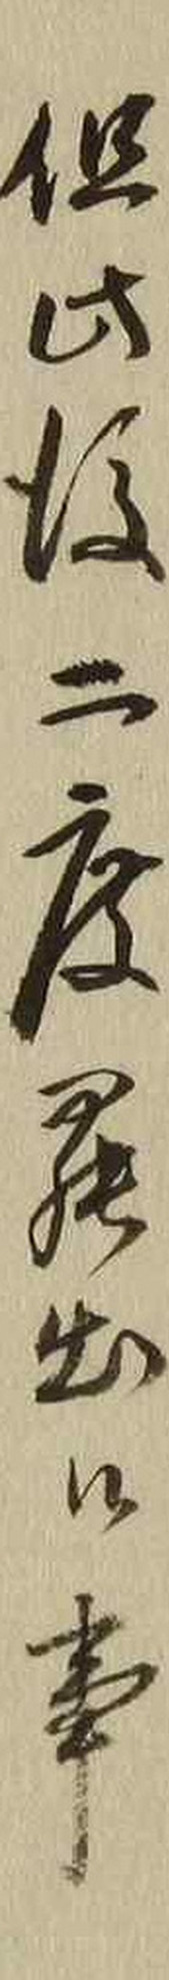但此後二度罷出候事
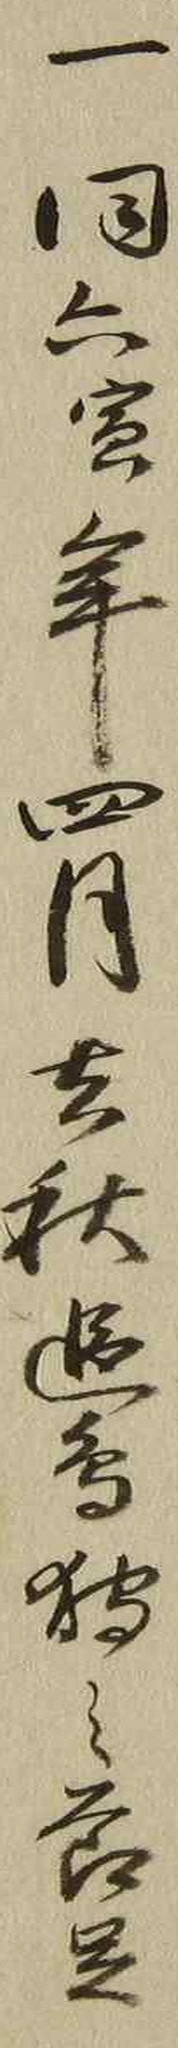一同六寅年四月去秋追鳥狩之節足
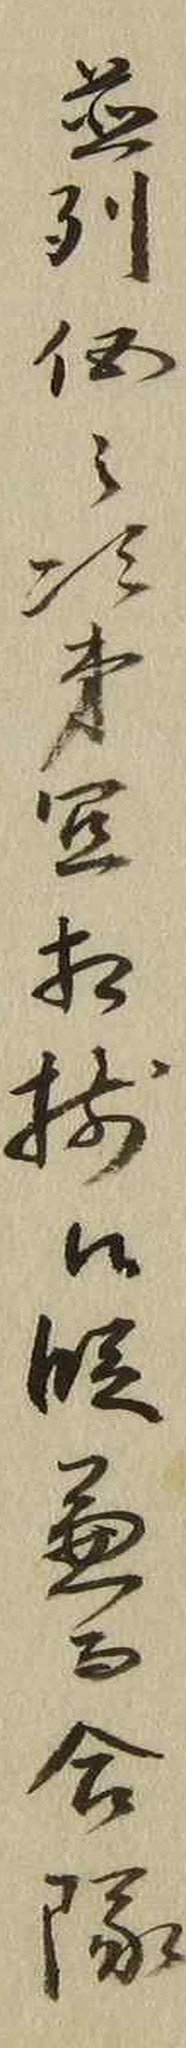並列伍之次第宜相揃候段兼而合隊
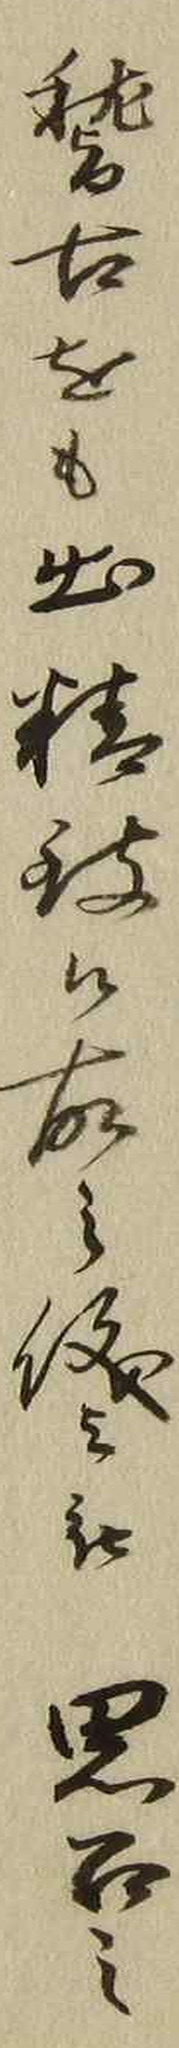稽古をも出精致候故之儀与被思召之
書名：諸士系譜　巻之128　た之部4
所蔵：会津若松市立会津図書館
